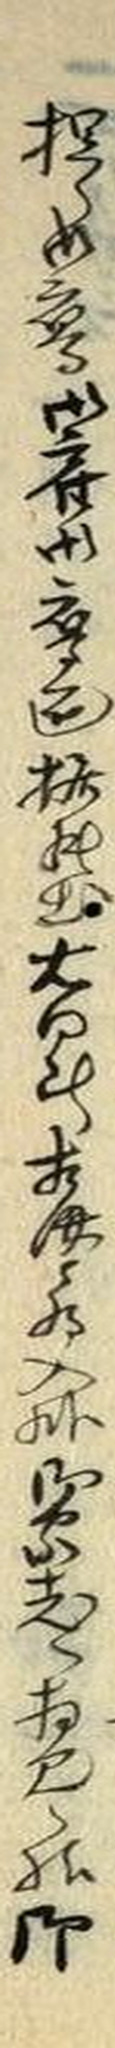捉候御鷹御雇御鷹匠据罷出右同断相済被為入掛御家老へ拝見候様御
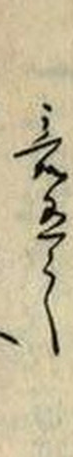意有之
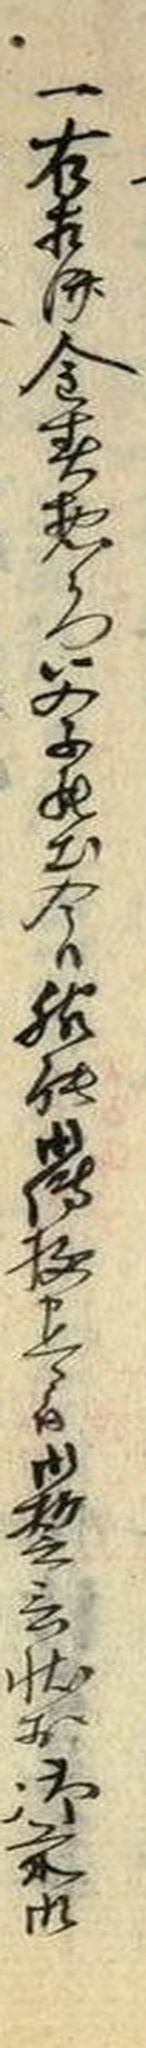一右相済金春惣右衛門父子罷出今日脇能御伝授申上候ニ付御誓言状於御前御
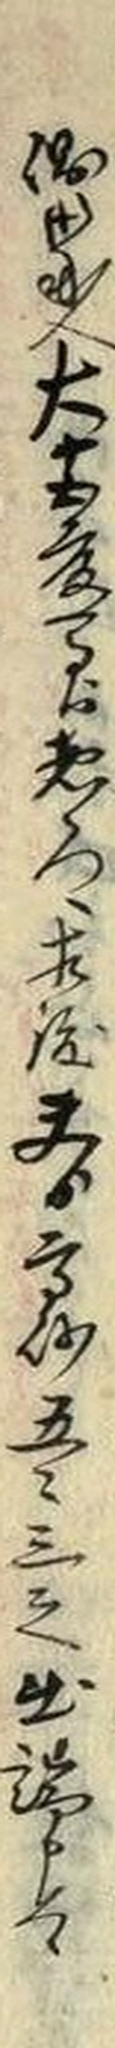側御用人大宮藤馬ゟ惣右衛門へ相渡夫ゟ高砂五々三之出端申上候

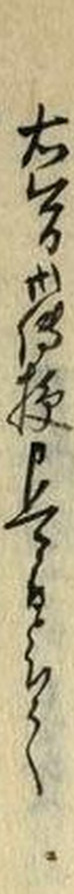右今日御伝授申上候ニ付被下之
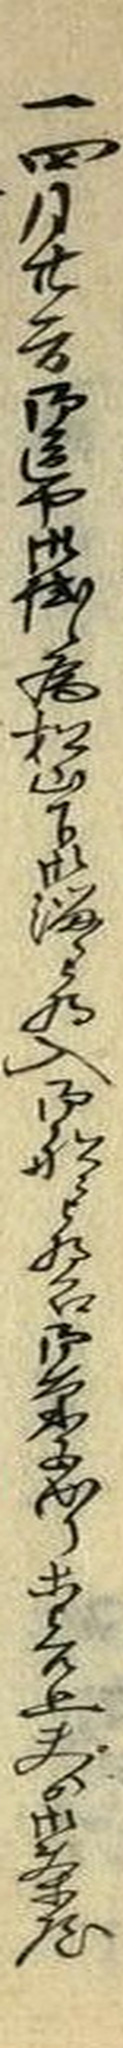一四月廿二日御道中御試候為松山下御溜り被為入御船ニ被為召御菓子代り等被召上夫ゟ御茶屋
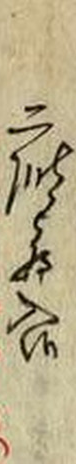二階被為入候
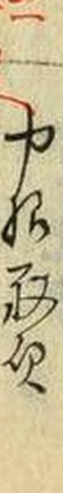中根靭負
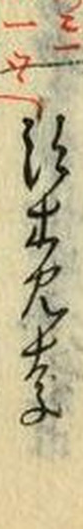鈴木忠太夫
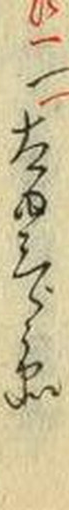太田三郎兵衛
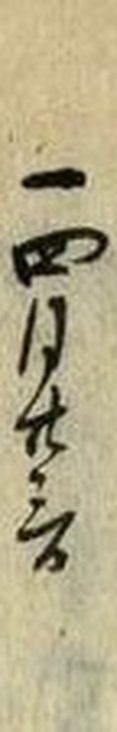一四月廿三日
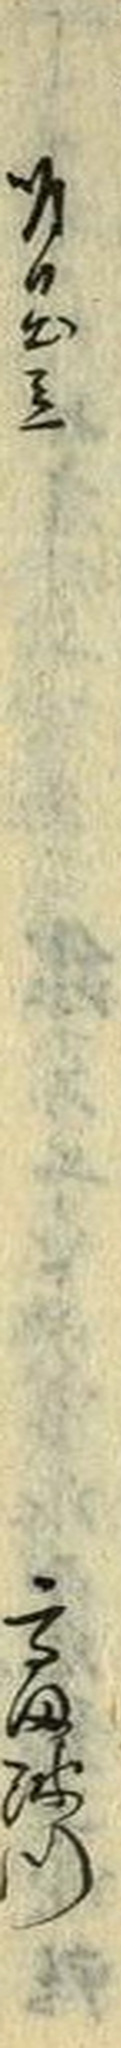昨日出立高田波門
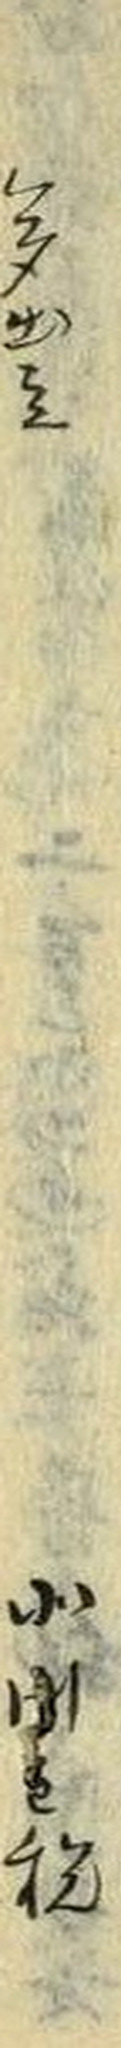今夕出立北川主税
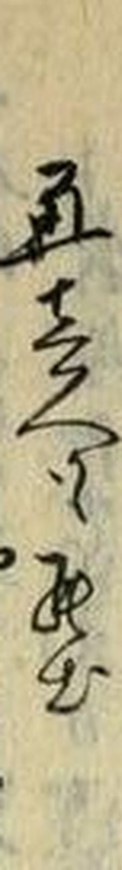再壱人ツヽ罷出
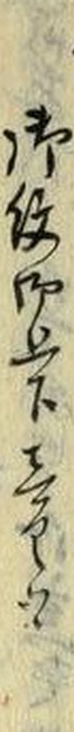御紋御上下壱具ツヽ
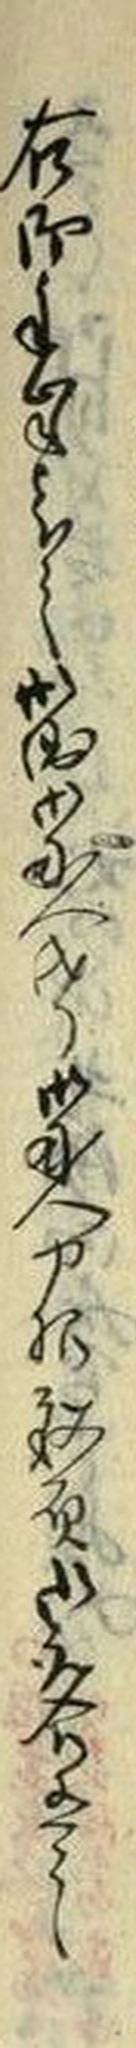右御手自被下之御側御用人代り御用人中根靭負御取合有之
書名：少傅日録抄（斉善付側向頭取日記、江戸并道中、初入在国、逝去後…
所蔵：福井県文書館 Fukui Prefectural Archives
